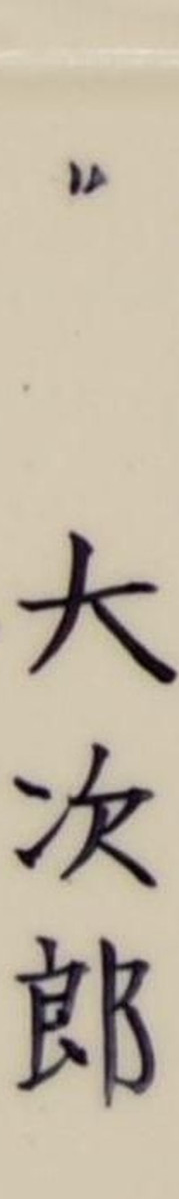大次郎
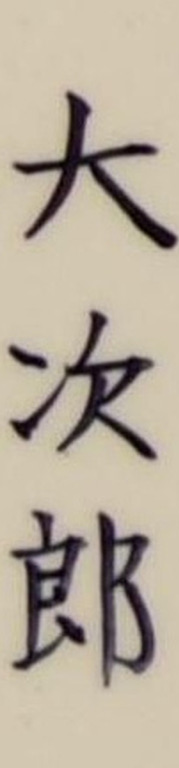大次郎
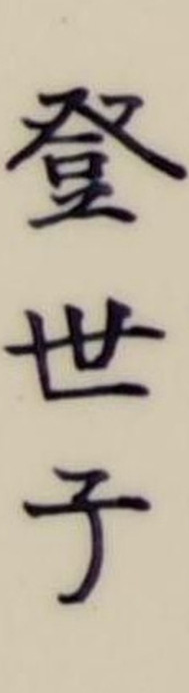登世子
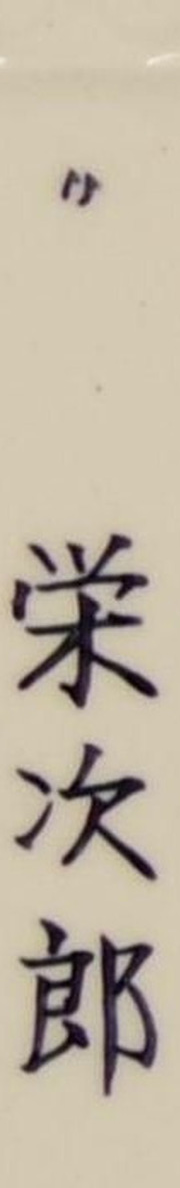栄次郎
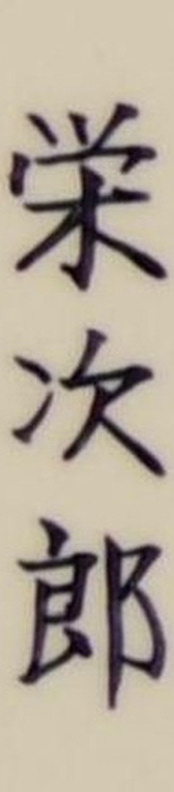栄次郎
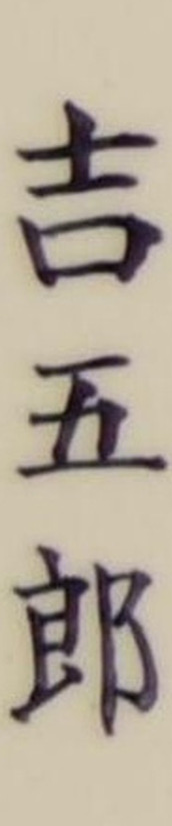吉五郎

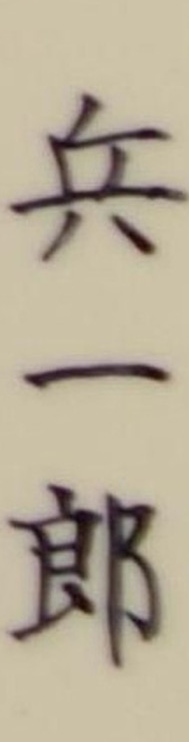兵一郎
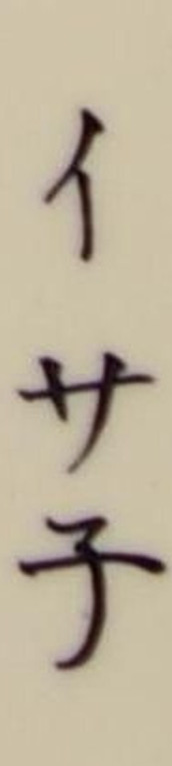イサ子
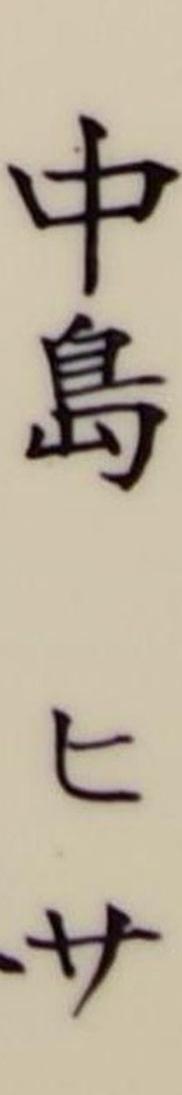中島ヒサ
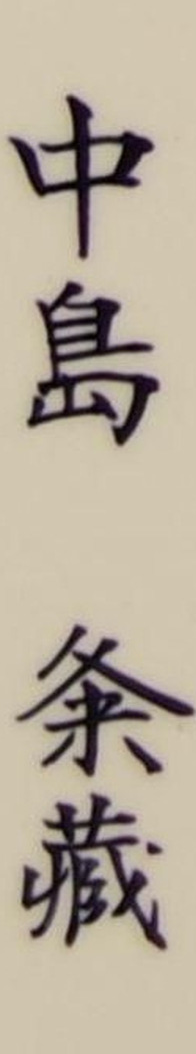中島粂蔵
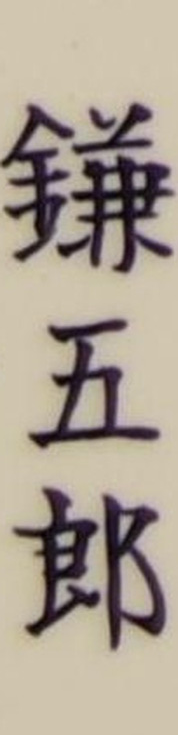鎌五郎

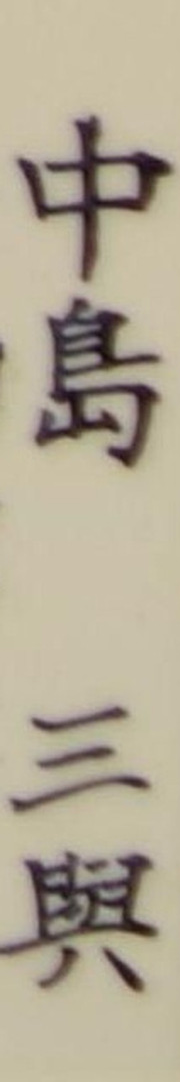中島三与
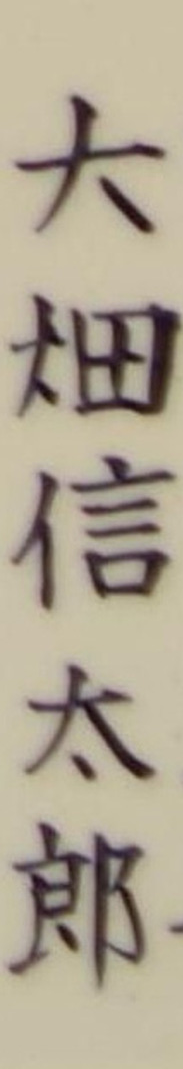大畑信太郎
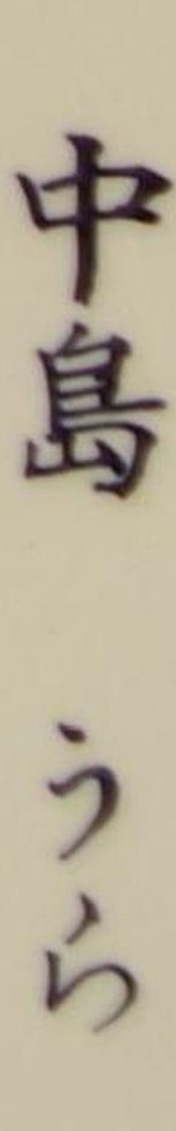中島うら
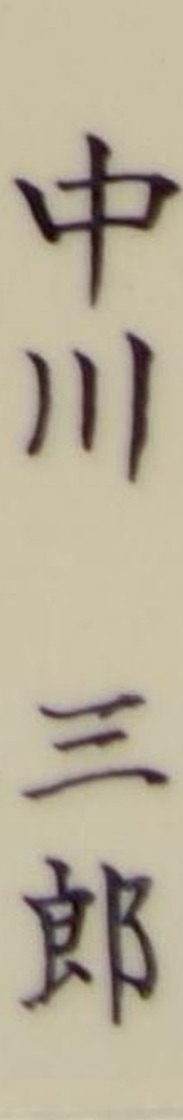中川三郎
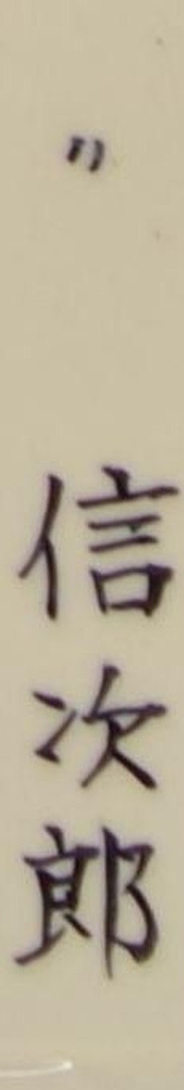信次郎
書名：A~D
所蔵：koyasan kongobuji
